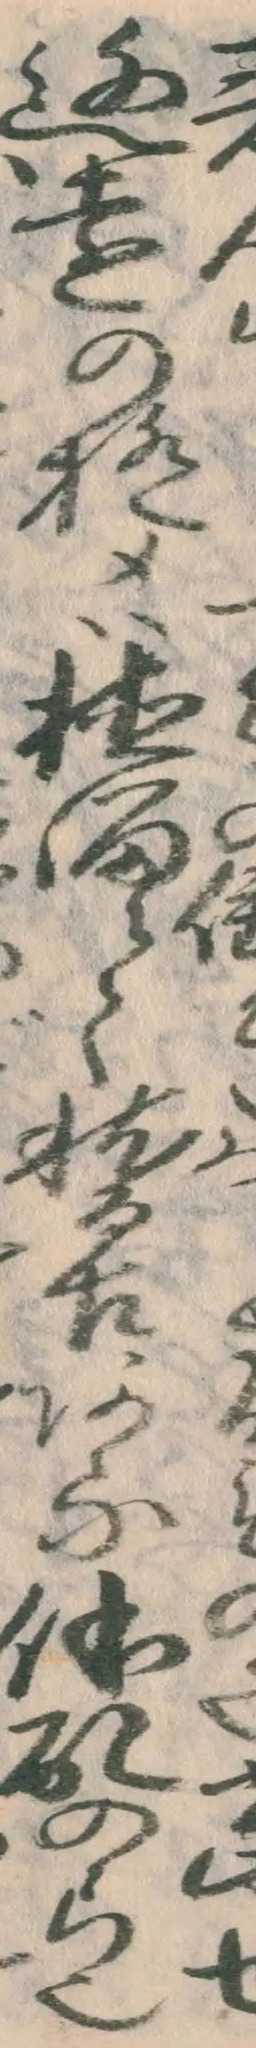遷遠の極メハ植溜ニて稽古ある体配の弓也
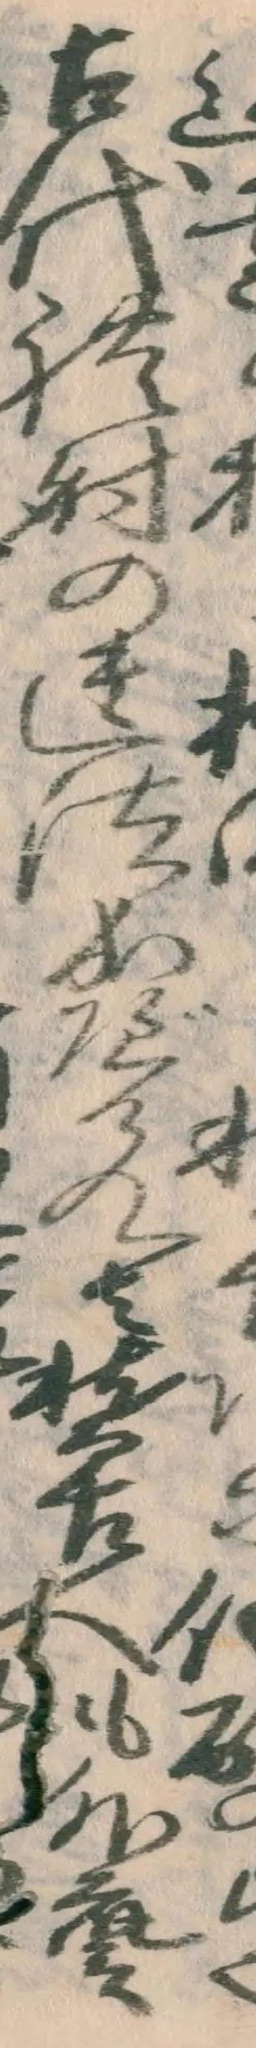古代禮射の遺法成べけれは稽古人も外藝
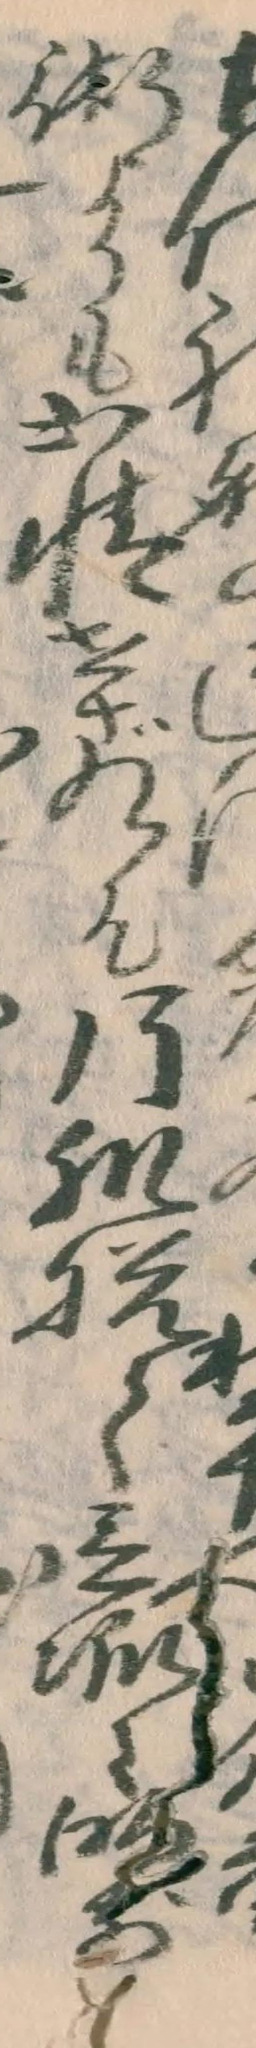術よりも出精せざれは片肌脱て立派に的前
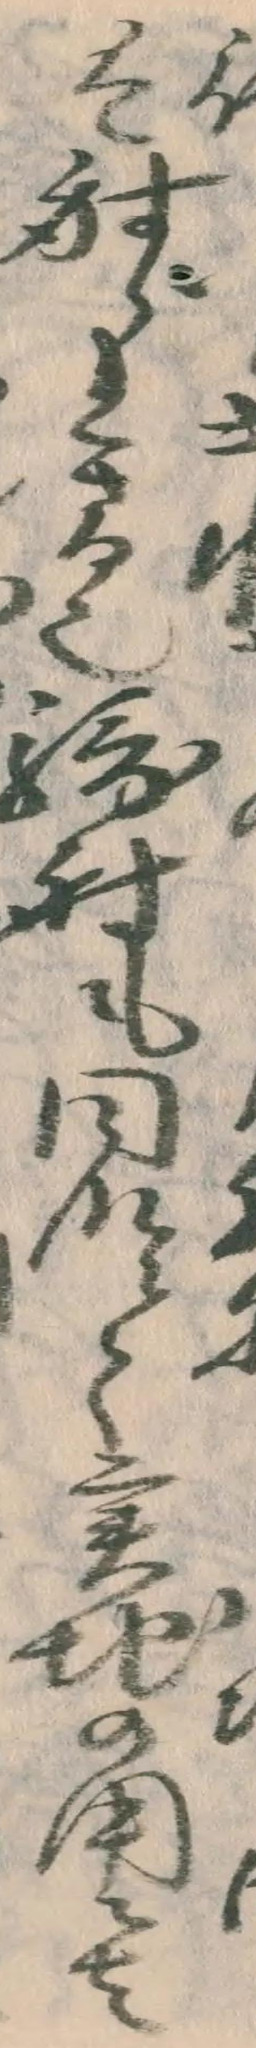は射られさる也騎射も同様ニて実地の用ニは
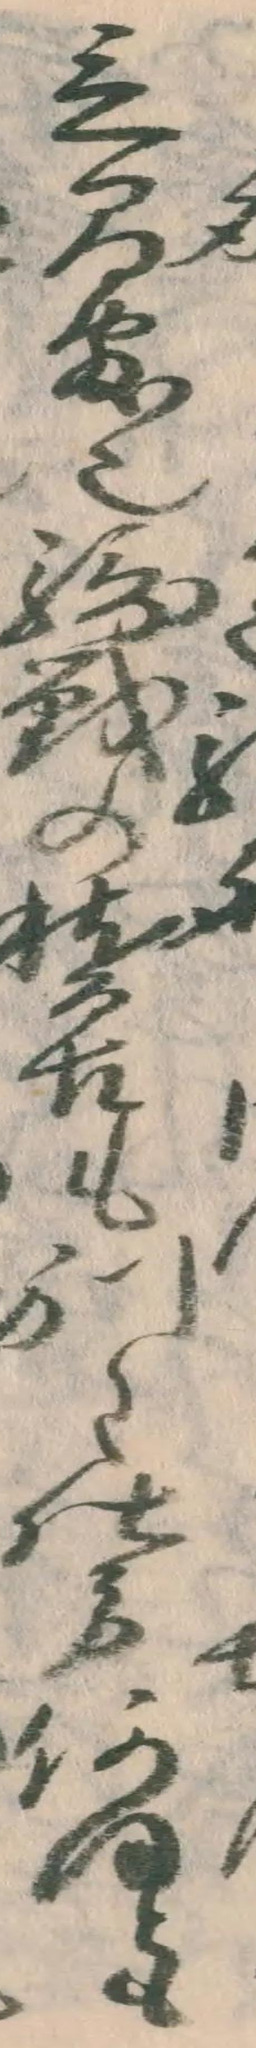立間敷也騎戦の稽古も別に仕方何ほとも
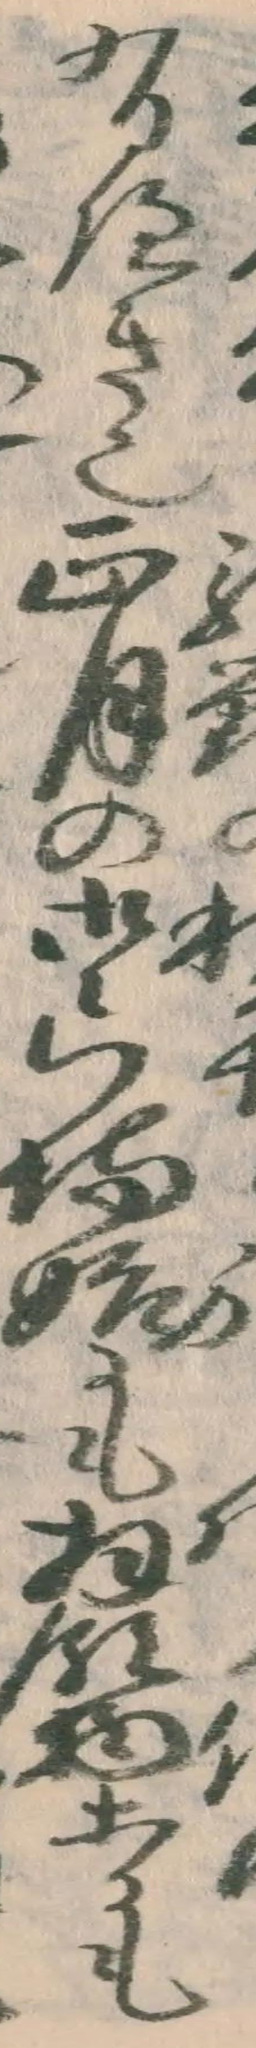有へき也正月の御弓場始にも拝領物等にも
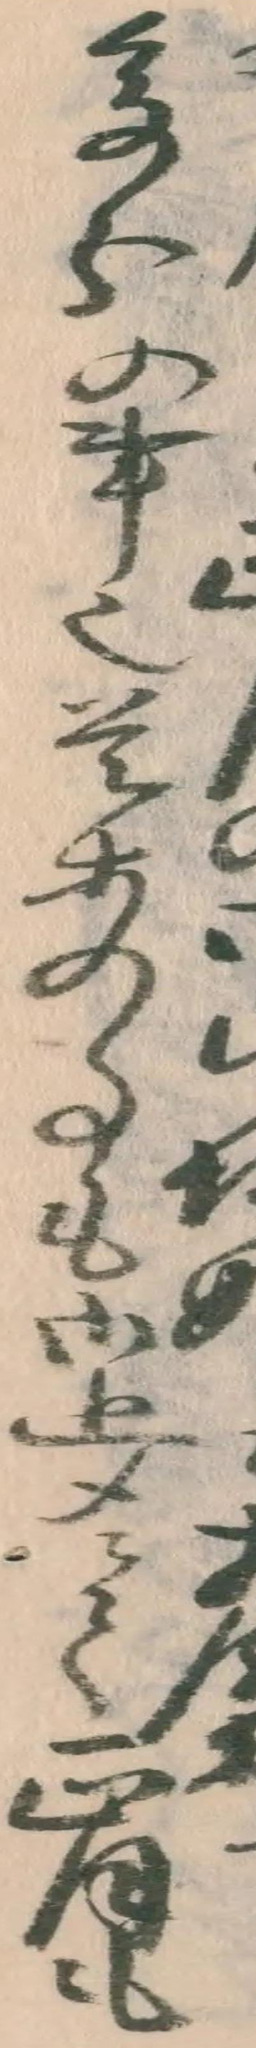多分の事也是等の事も御止メニて正月も
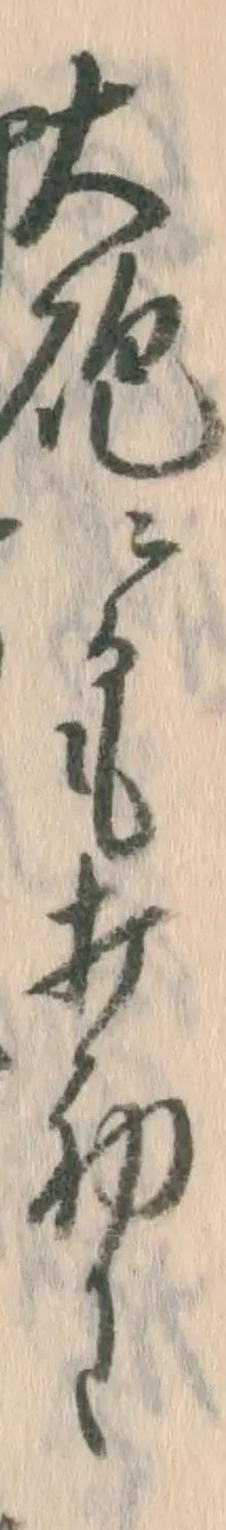大砲ニ而も打初に
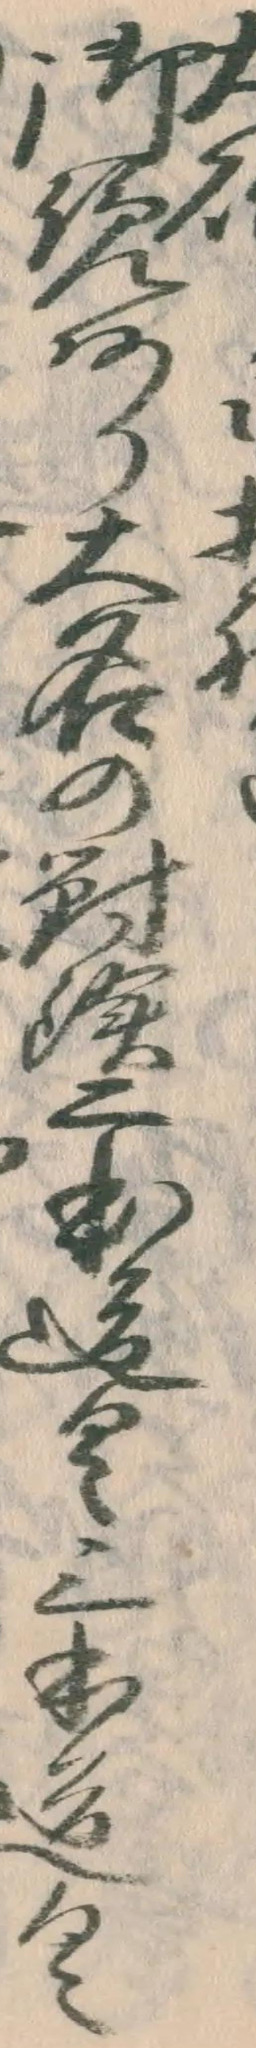御覧あり大名の戦鎗二本道具三本道具
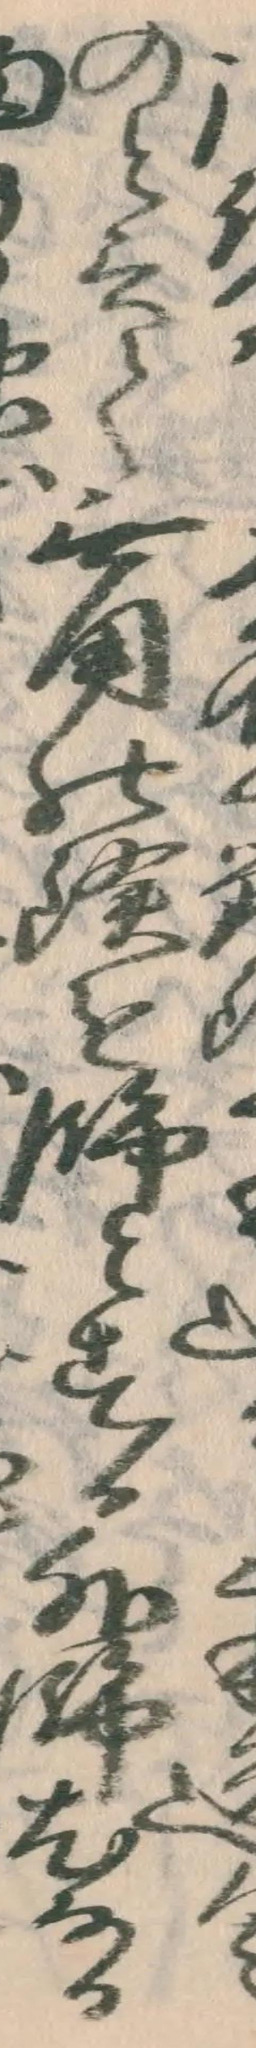のと云て無用の槍を飾とする外飾尤なる
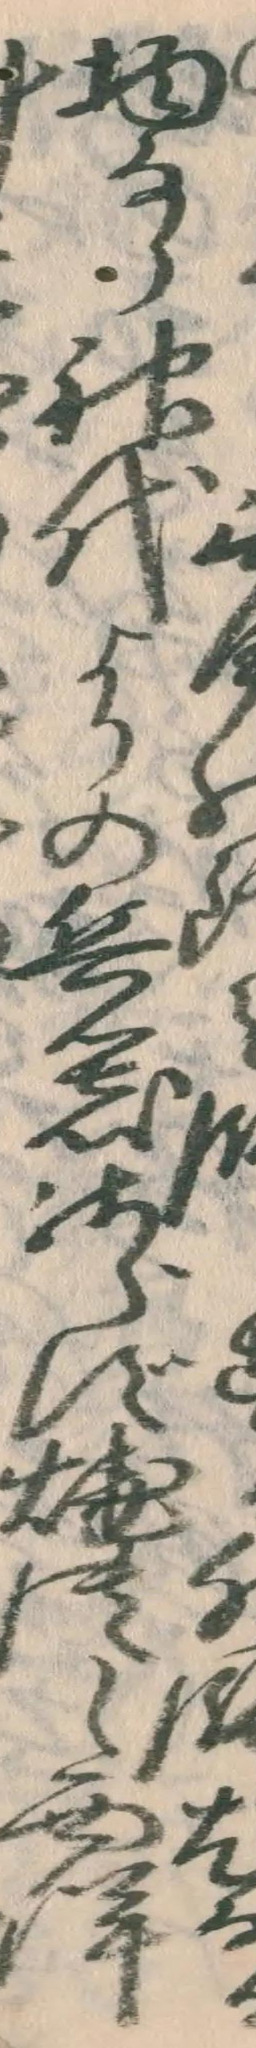物なり神代よりの兵器残らず焼潰し西洋
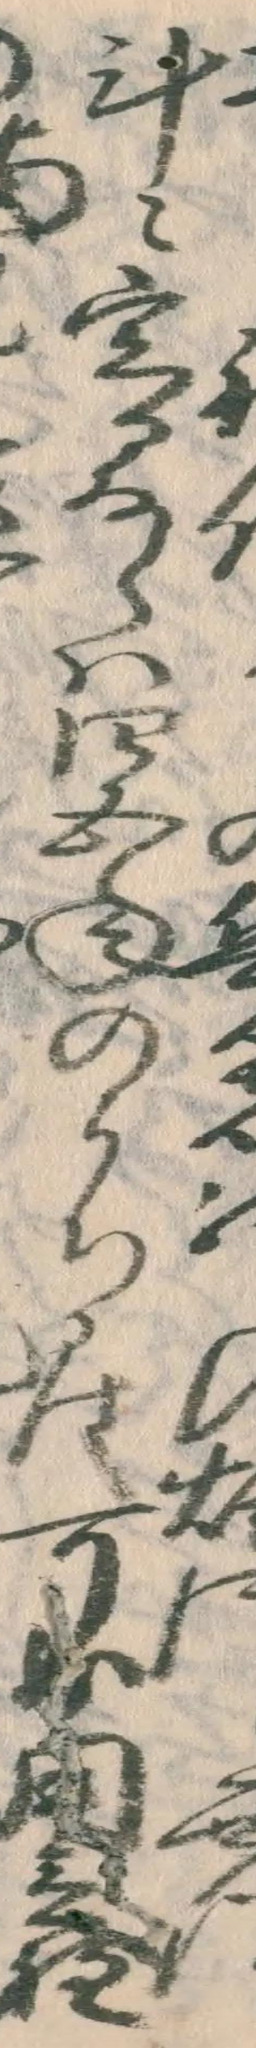斗ニ定るならハ四五年のうちには可成用立程
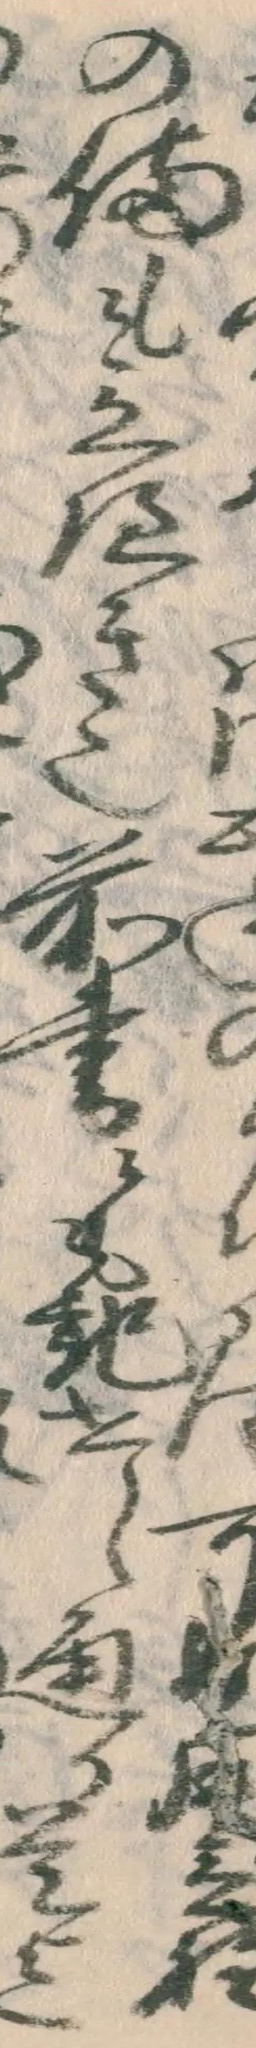の備も立へき也前書ニも記せし通り是迄
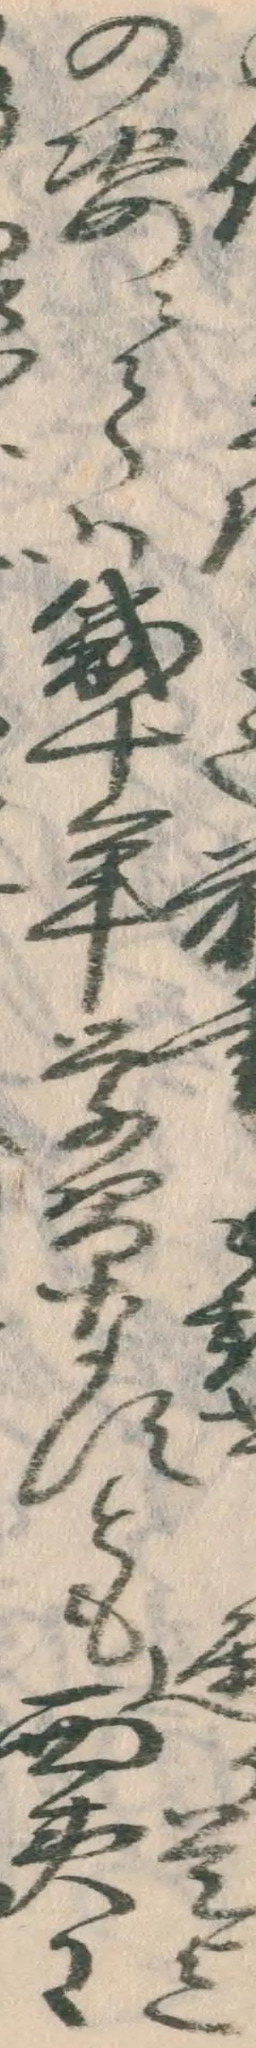の姿ニてハ幾十年学習なすとも西夷に
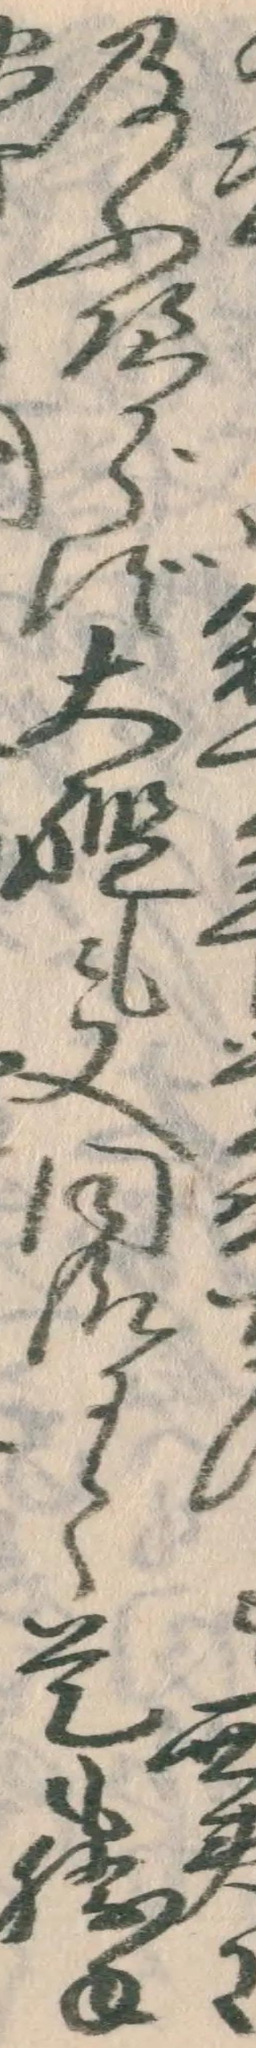及ふへからず大艦も又同様にて是も勝手
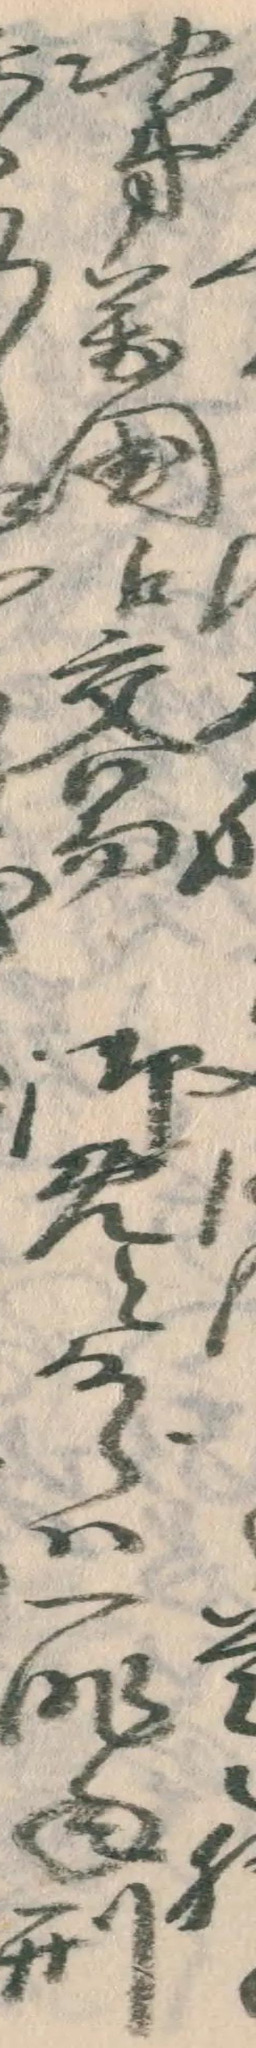次第萬国江交易御免とならハ一昨年刑
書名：麗斎叢書. 20
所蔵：国立国会図書館 National Diet Library, JAPAN
